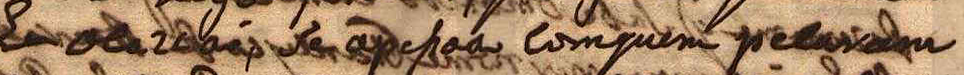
he ocaziaõ se a pessoa com quem pecaram
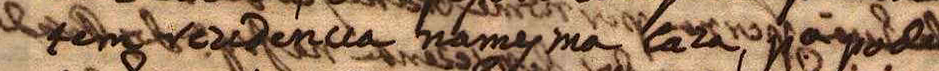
tem rezedencia na mesma caza, p.a poder
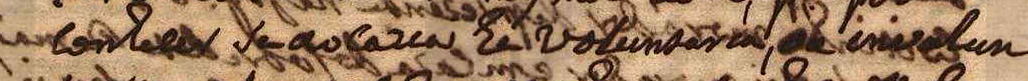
Conhecer se a ocazeaõ he voluntarea, ou involun
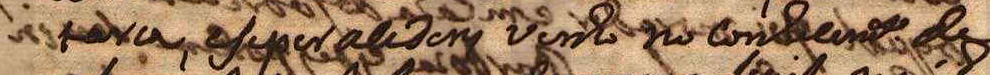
tarea, e se pera ceder venho no conhecen.to de
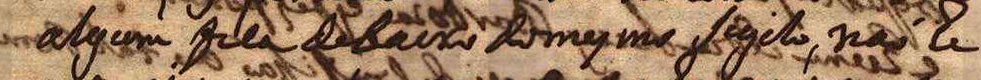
algum fica de baixo do mesmo segilo, naõ he
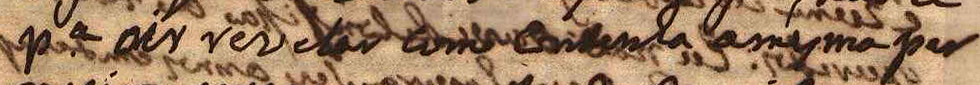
p.a o ir revelar como contenha a mesma per
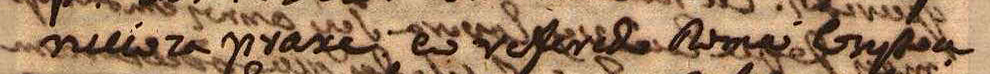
necioza praxe eo referedo Romaõ constou
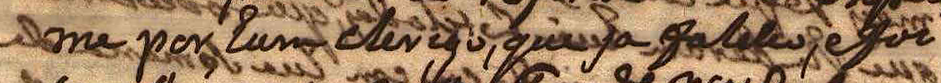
me por hum clerigo, que ja faleceo, e foi
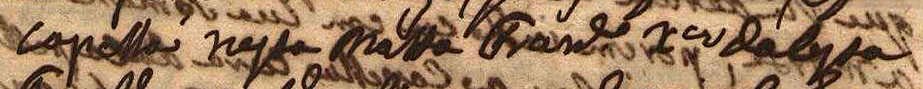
capellaõ nesta Matta Fran.co Xr da Costa
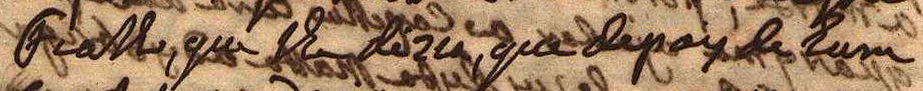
Fialho, que lhe dizea, que depois de hum
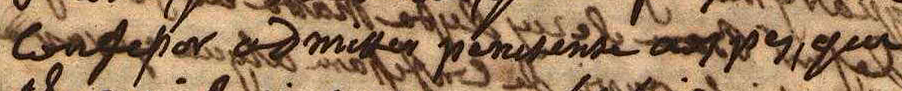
confessor admitter penetente aos pes, que
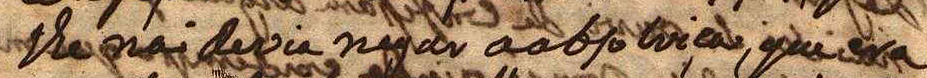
lhe naõ devia negar a absolviçaõ, que era
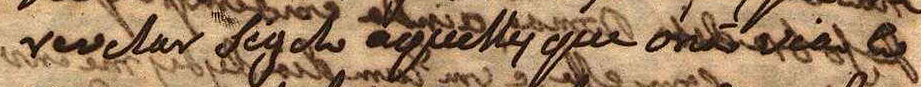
revelar segelo aquelles que o naõ viao co
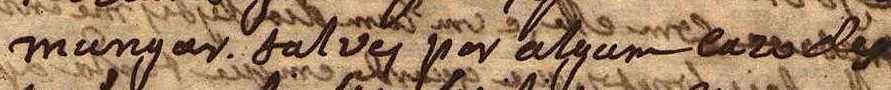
mungar talves por algum cazo des
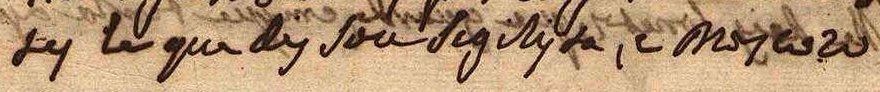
tes he que dis Sou segilista, e moscozo
